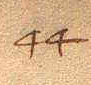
44
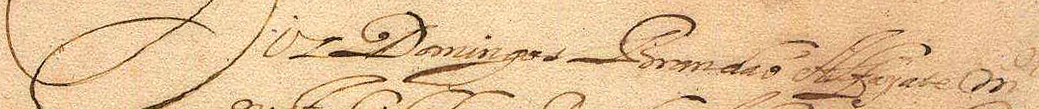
Diz Domingos Brandaõ Alfayate mor.
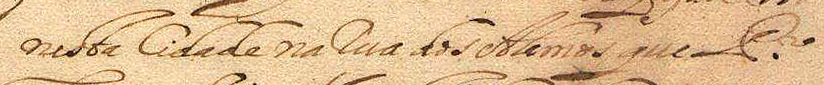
nesta Cidade na Rua dos Alamos que P.o
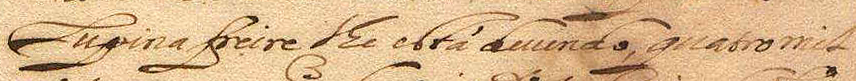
Lupina freire lhe está deuendo, quatro mil
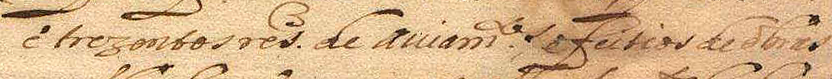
e trezentos rēs de auiam.tos, e feitios de obras
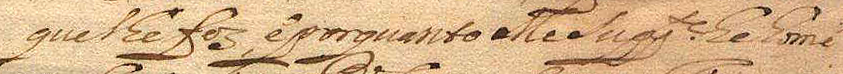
que lhe fez, e porquanto elle supp.te he homē
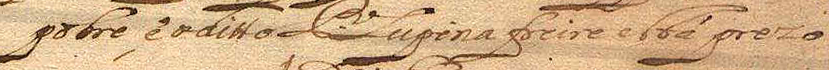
pobre, e o ditto P.o Lupina freire está prezo
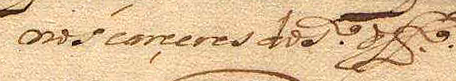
nos carceres do s.to off.o.
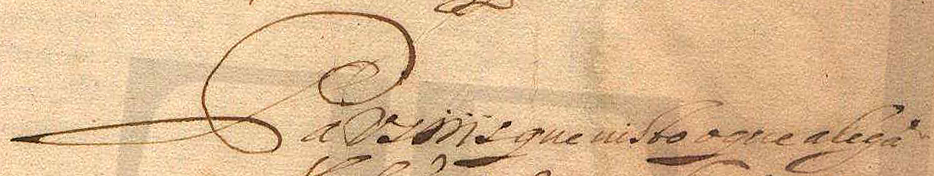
P a vs m̄s que uisto o que alegā
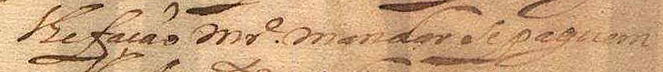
lhe façaõ mr.e mandar se paguem
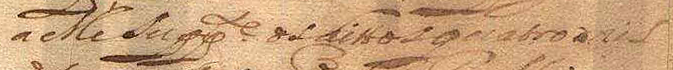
a elle supp.te os dittos quatro mil
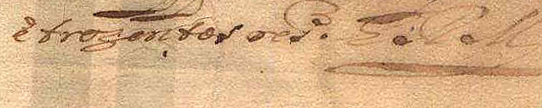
e trezentos ors̄. E R M
